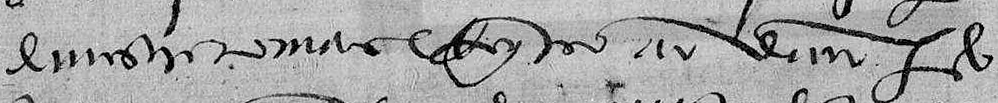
de mestre tomas e Req̄reo ao ditto Ldo
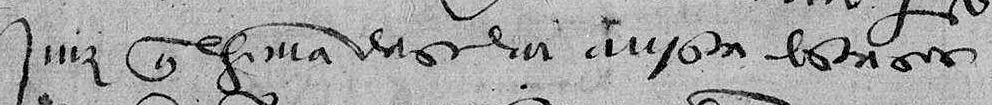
Juiz q̄ lhe mādase dar a ujsta desta sos
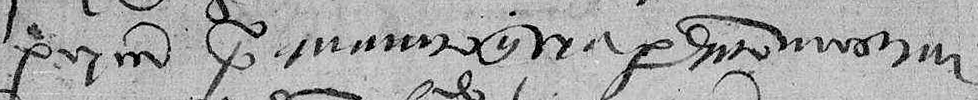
peyçā p̄oquamto q̄rya ꝑ drrto mostrar
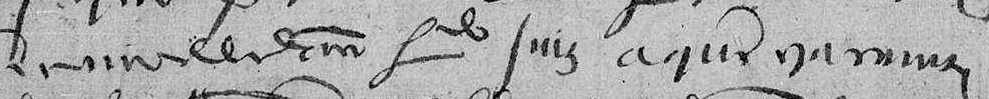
ē como elle ditto Ldo Juiz a quē era comety
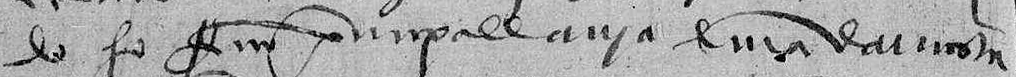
do ho feito p̄ncipall auja de mādar nesta
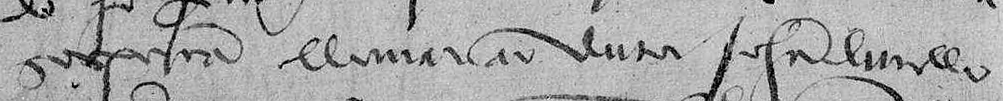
sospeyçā llouuar ao doutor Johā de mello
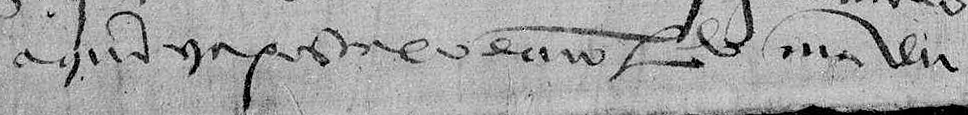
a quē era posta e o ditto Ldo mādou
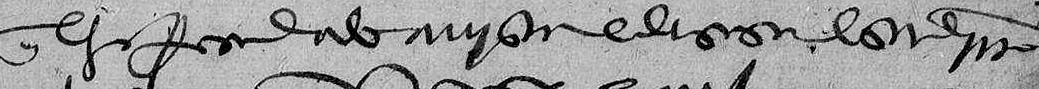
q̄ lhe fose dado a ujsta e disese de seu dr̄rto
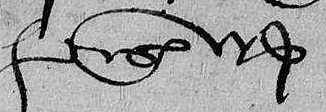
ho esp̄vy
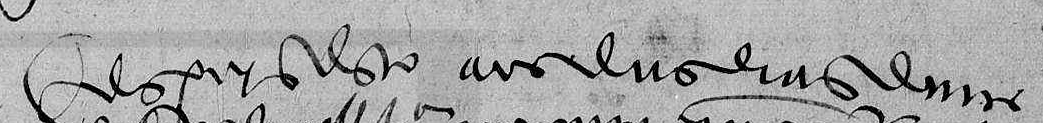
E despoys desto aos dous dias do mes
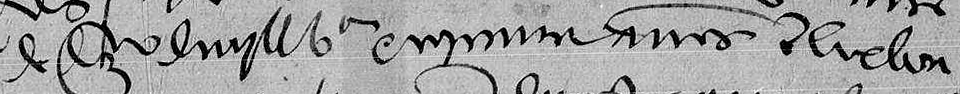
de dezro de mjll vc e coremta an̄os ē lixboa
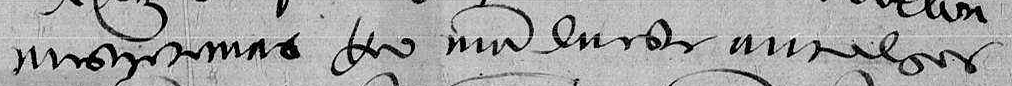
mestre tomas Reo mādou este auto de sos
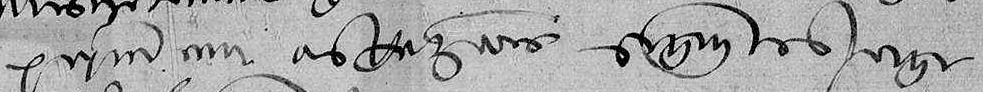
peyçā com as Razõoes seguj̄tes Jorge
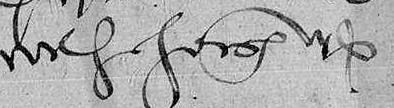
coelho ho esp̄vy
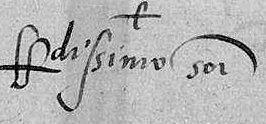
Rdissimo s̄or
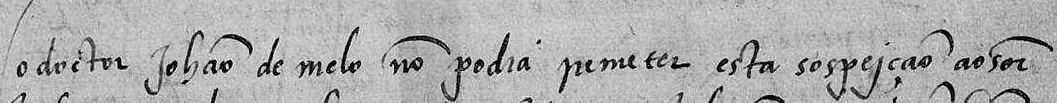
o doctor Johão de melo n̄o podia remeter esta sospejção ao sōr
